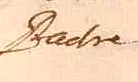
Padre
